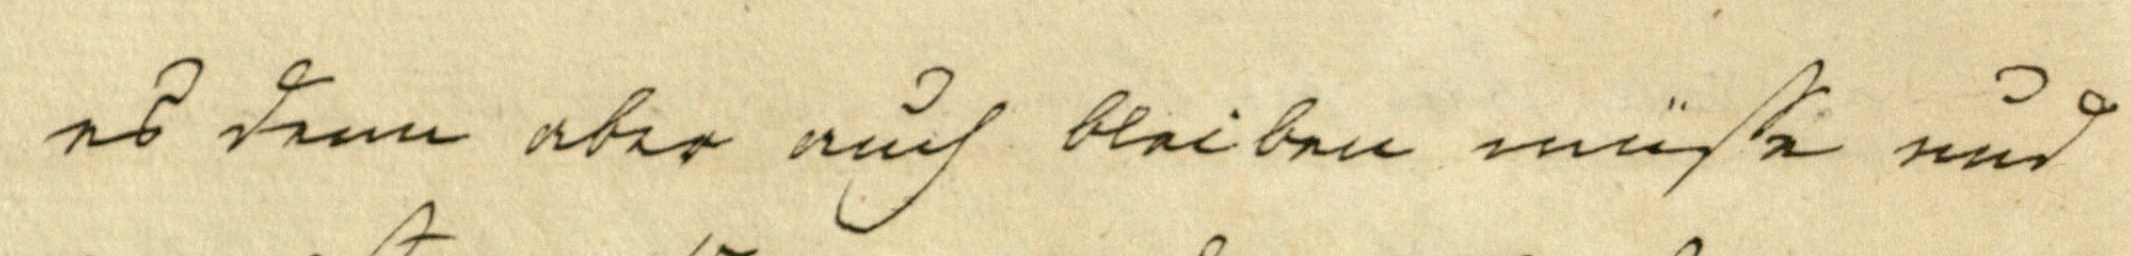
es denn aber auch bleiben müsse und
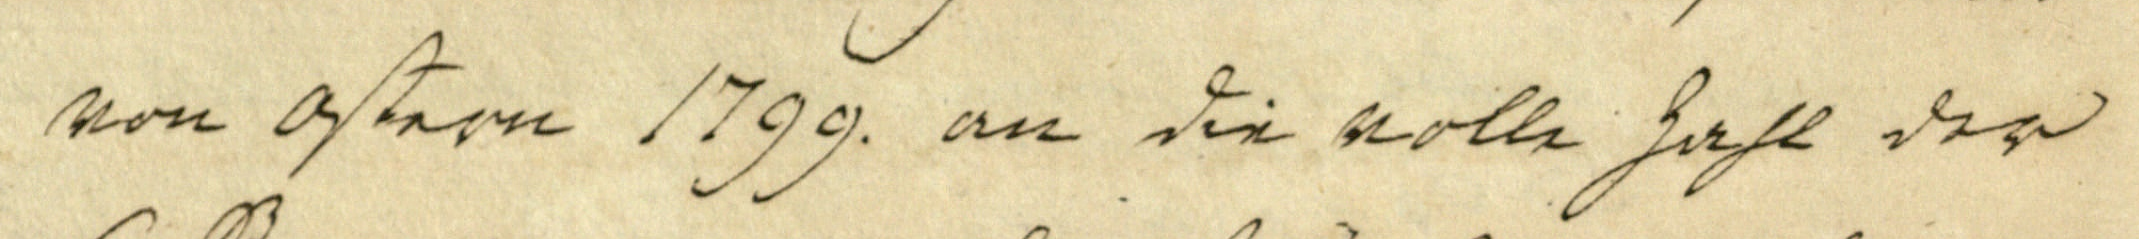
von Ostern 1799. an die wolle Zahl der
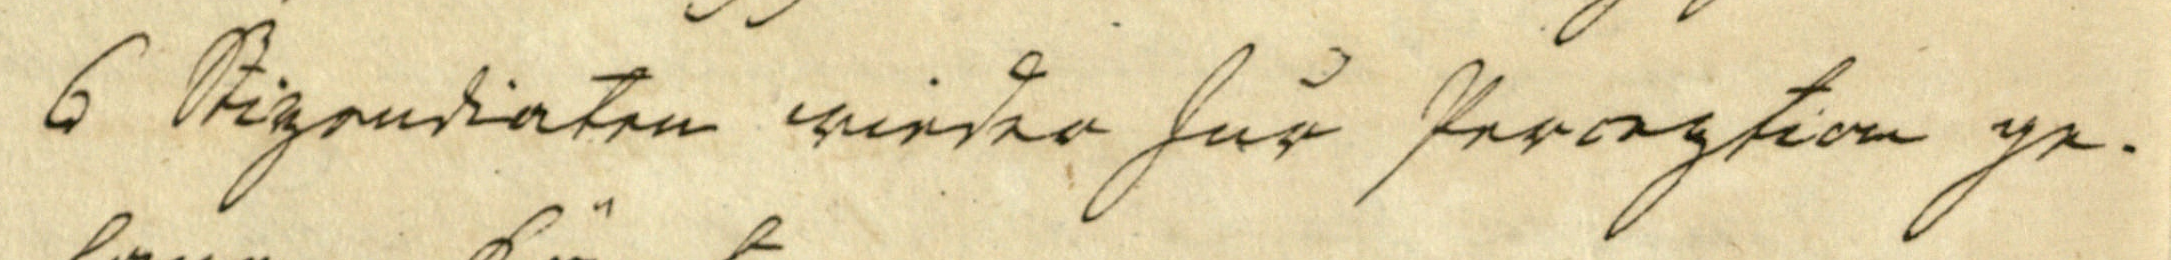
6 Stipendiaten wieder zur Perception ge¬
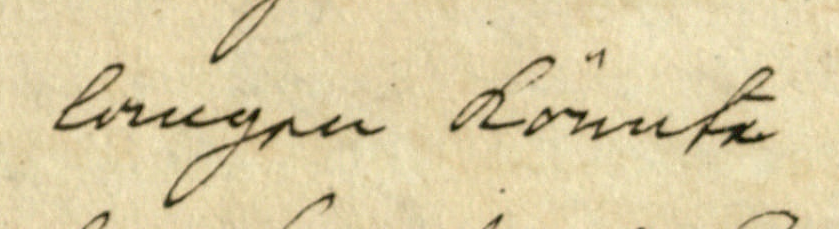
langen könnte.
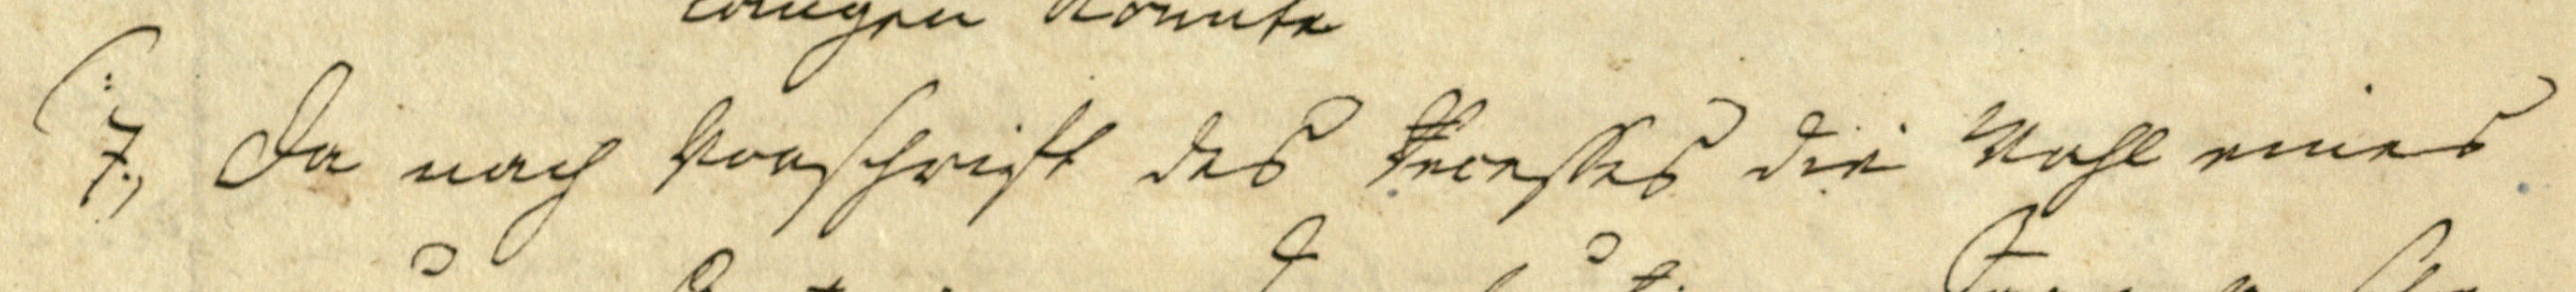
7., Da nach Vorschrift des Recesses die Wahl eines
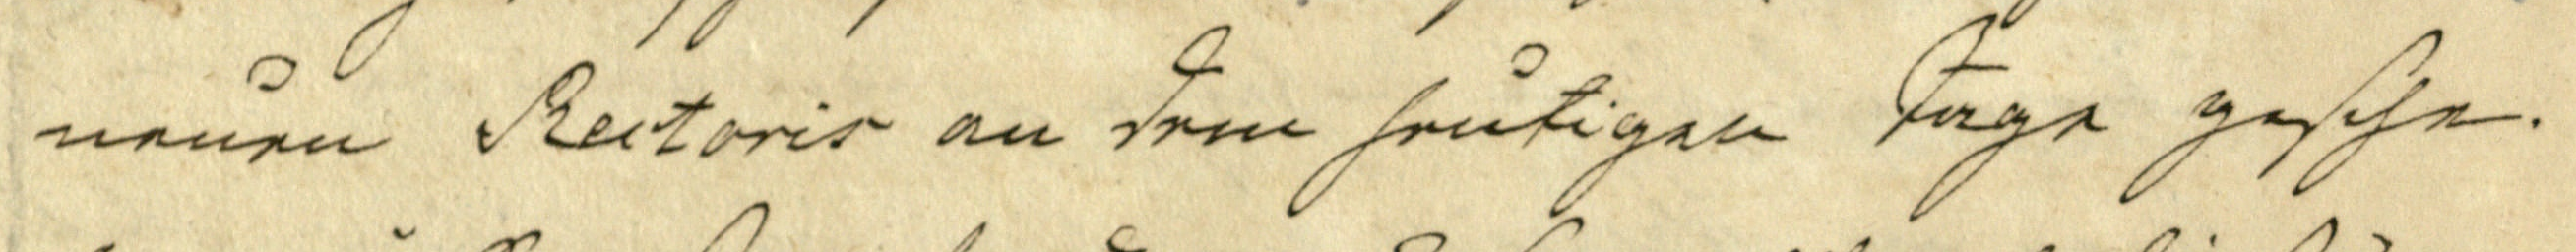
neuen Rectoris an dem heutigen Tage gesche¬
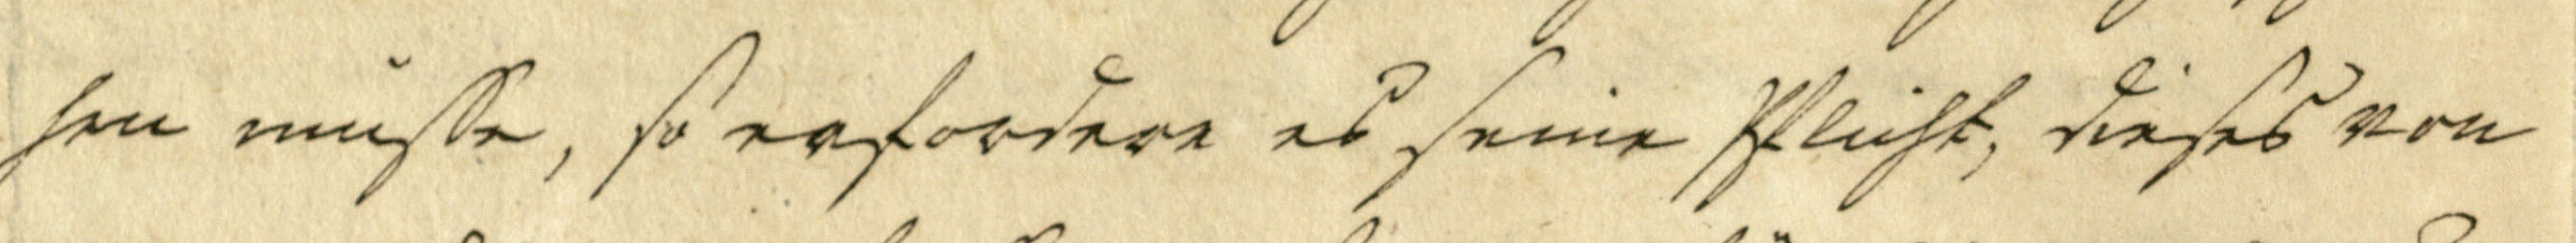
den müsse, so erfordere es seine Pflicht, dieses von
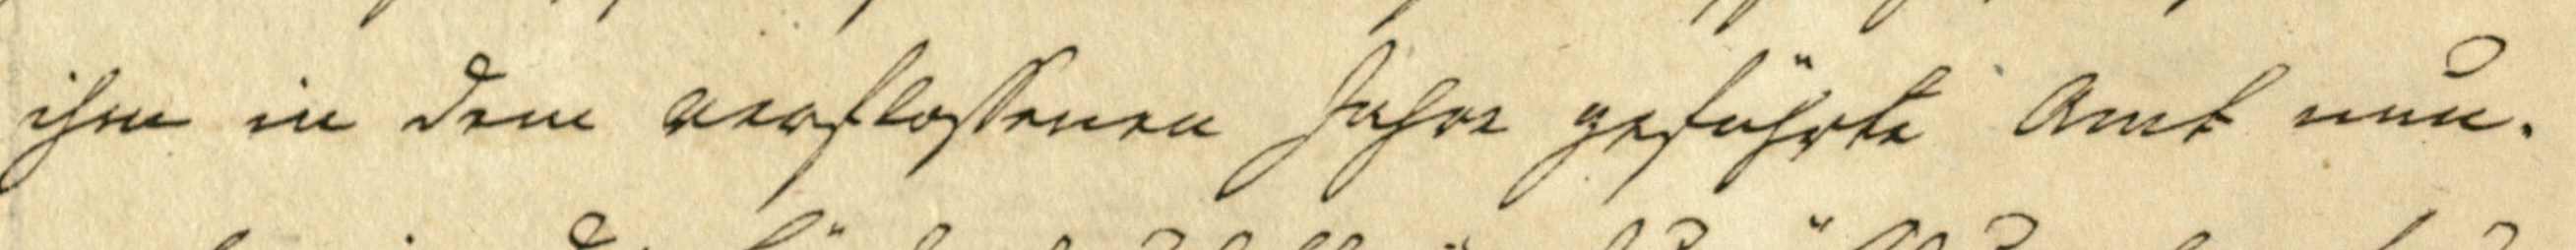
ihm in dem verflossenen Jahre geführten Amt nun¬
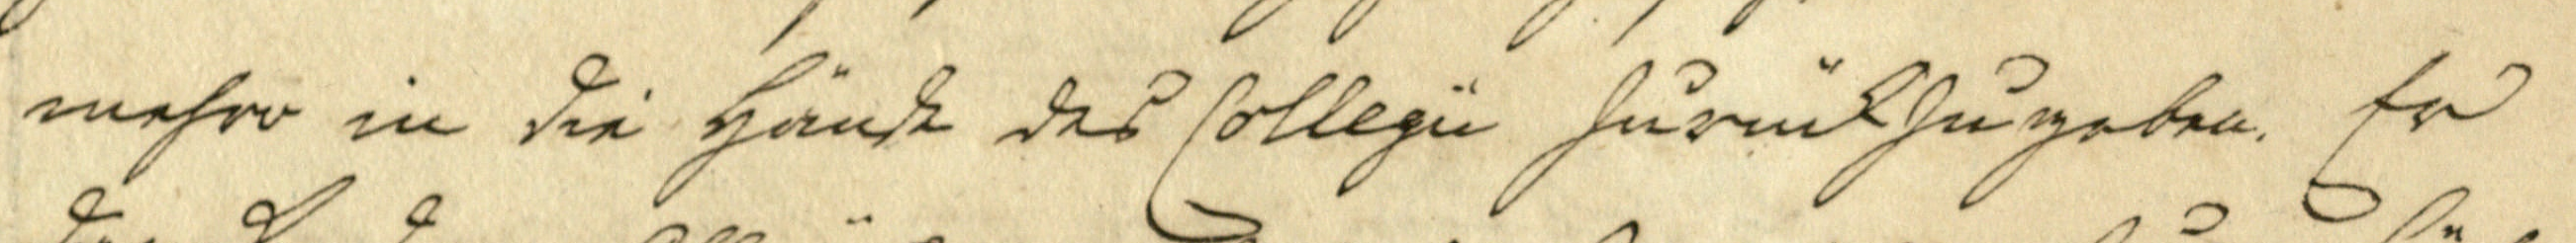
mehro in die Hände des Collegii zurückzugeben. Er
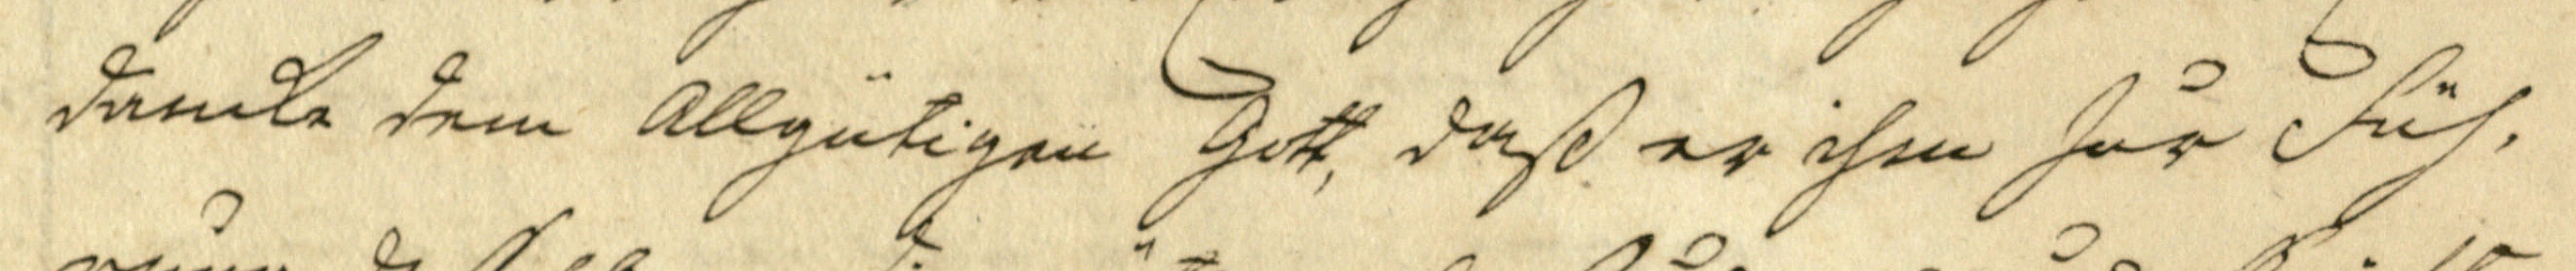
dancke dem Allgütigen Gott, daß er ihm zur Füh¬
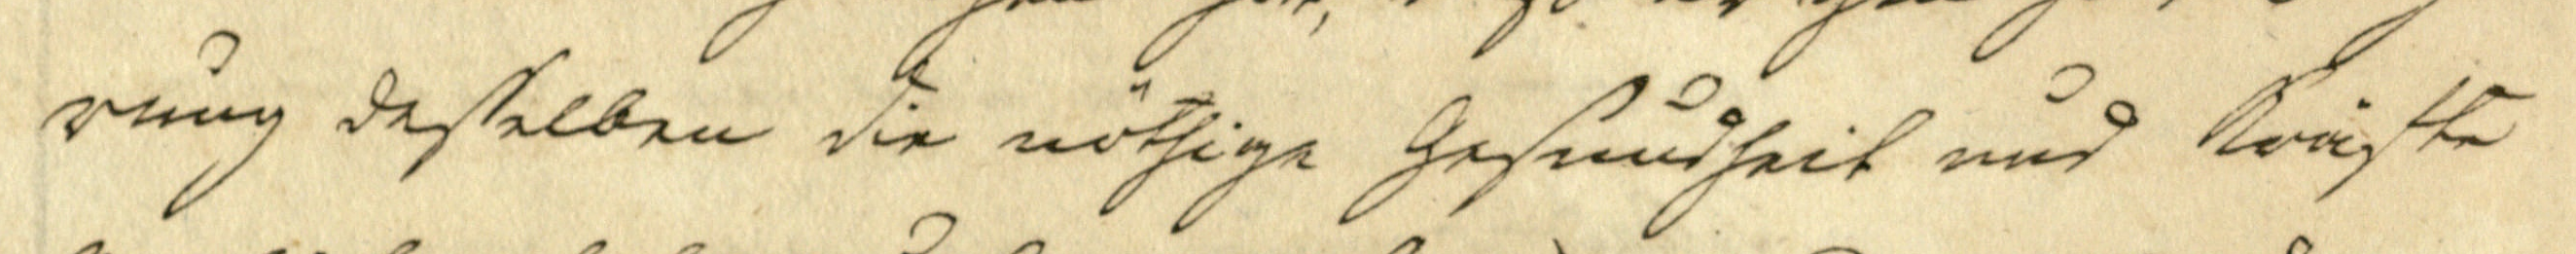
rung desselben die nöthige Gesundheit und Kräfte
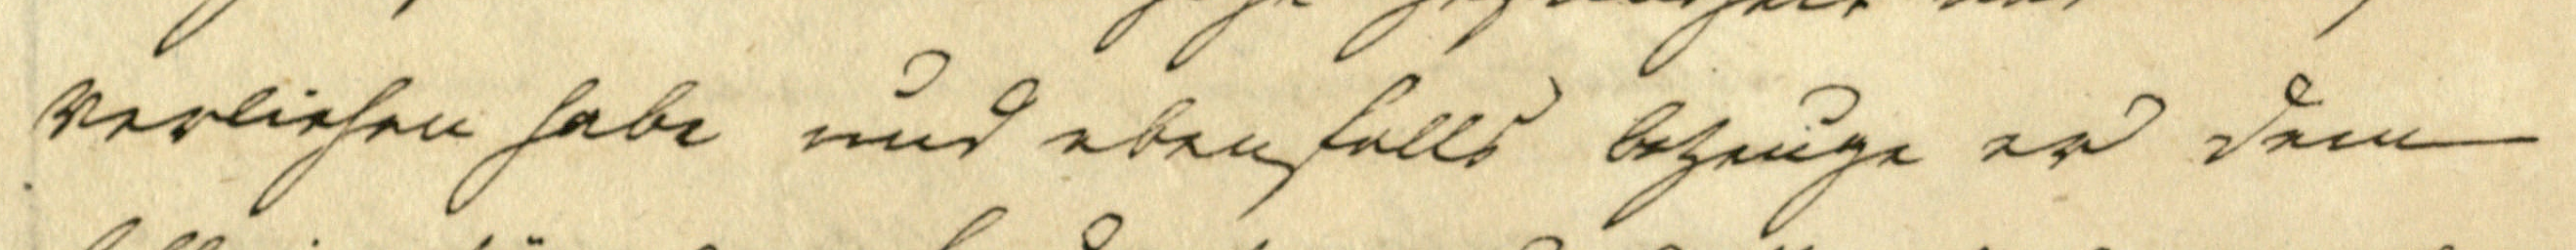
verliehen habe und ebenfalls bezeuge er dem
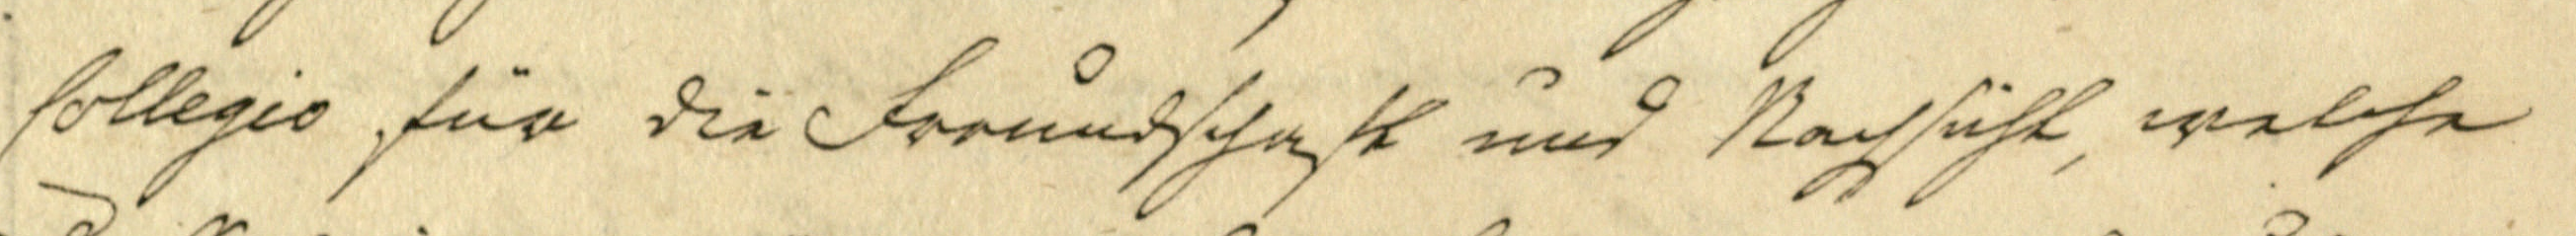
Collegio für die Freundschaft und Nachsicht, welche
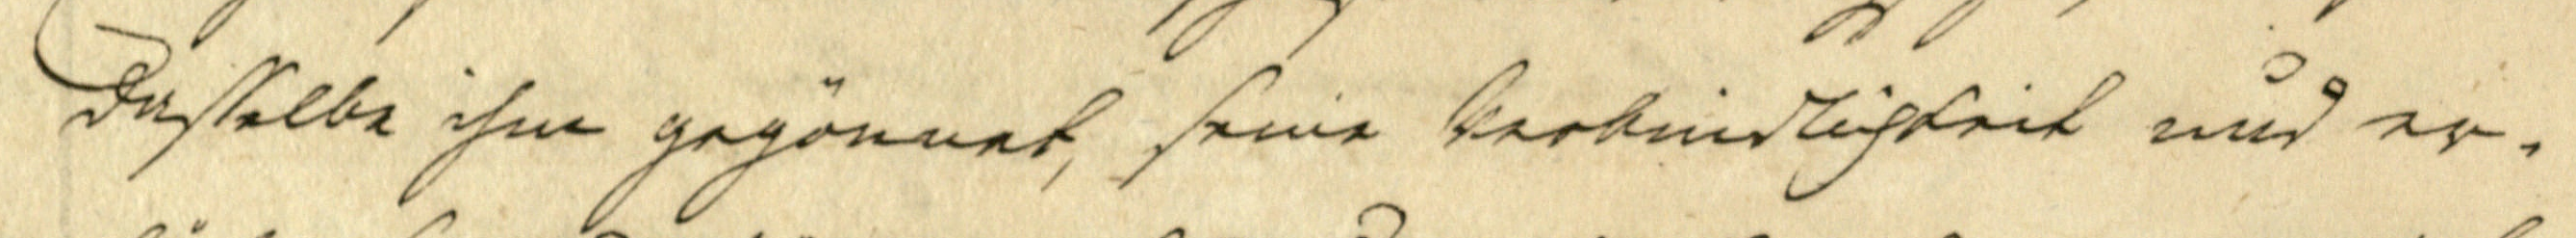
dasselbe ihm gegönnet, seine Verbindlichkeit und er¬
